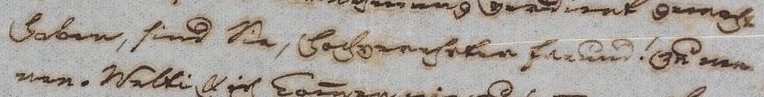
haben, sind Sie, hochverehrter Freund! zu nen-
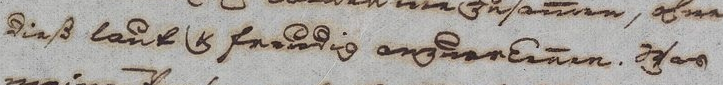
dieß laut & freudig anzuerkennen. Was
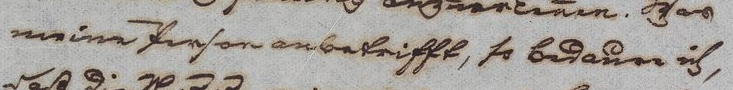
meine Person anbetrifft, so bedaure ich,
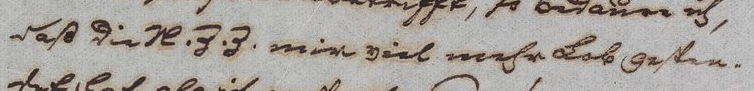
daß die N.Z.Z. mir viel mehr Lob gespen-
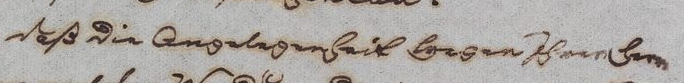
Daß die Angelegenheit wegen Ihres Herrn
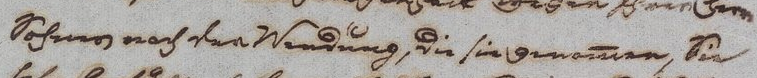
Sohnes nach der Wendung, die sie genommen, Sie
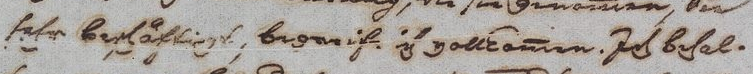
sehr beschäftigt, begreife ich vollkommen. Ich behal-
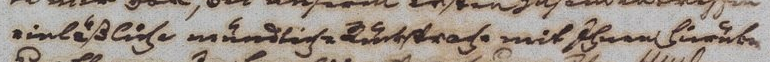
einläßlich mündliche Rücksprache mit Ihnen hierüber
